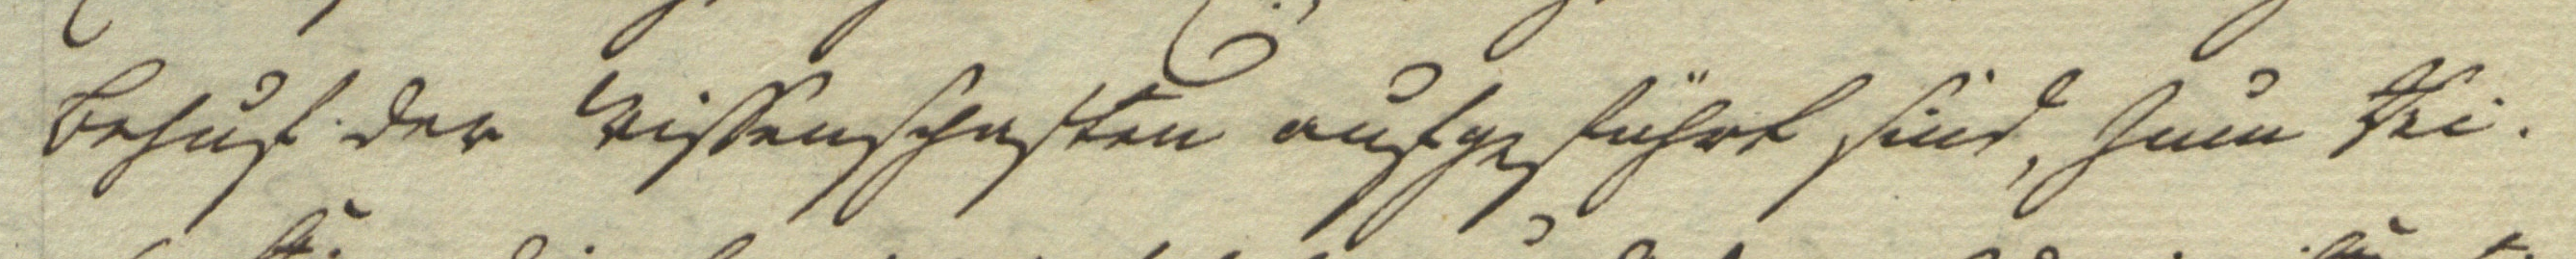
Behuf der Wissenschaften aufgeführt sind, zum Rei¬
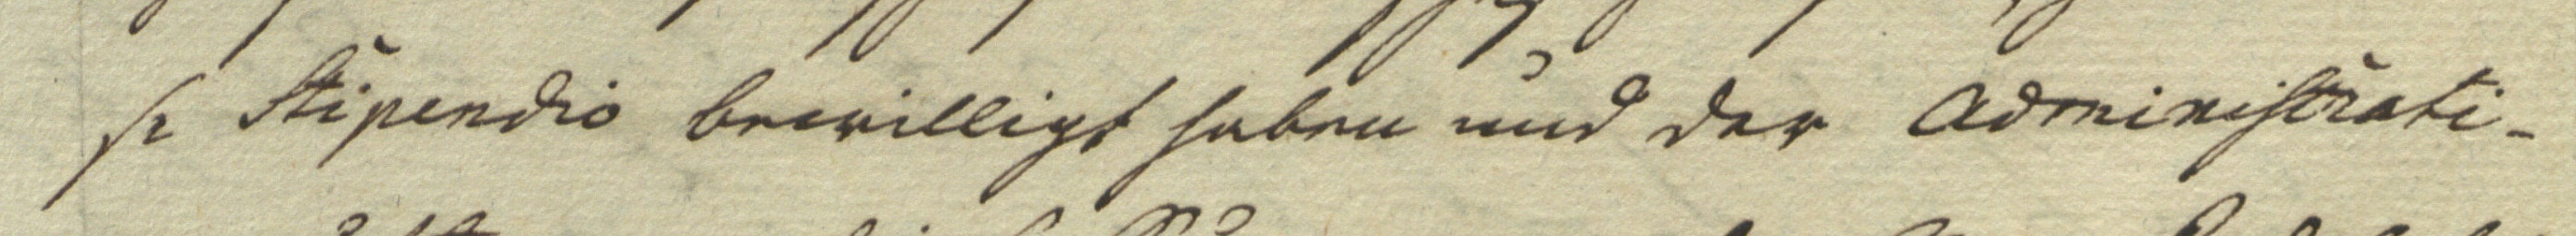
se Stipendio bewilligt haben und der Adminserati¬
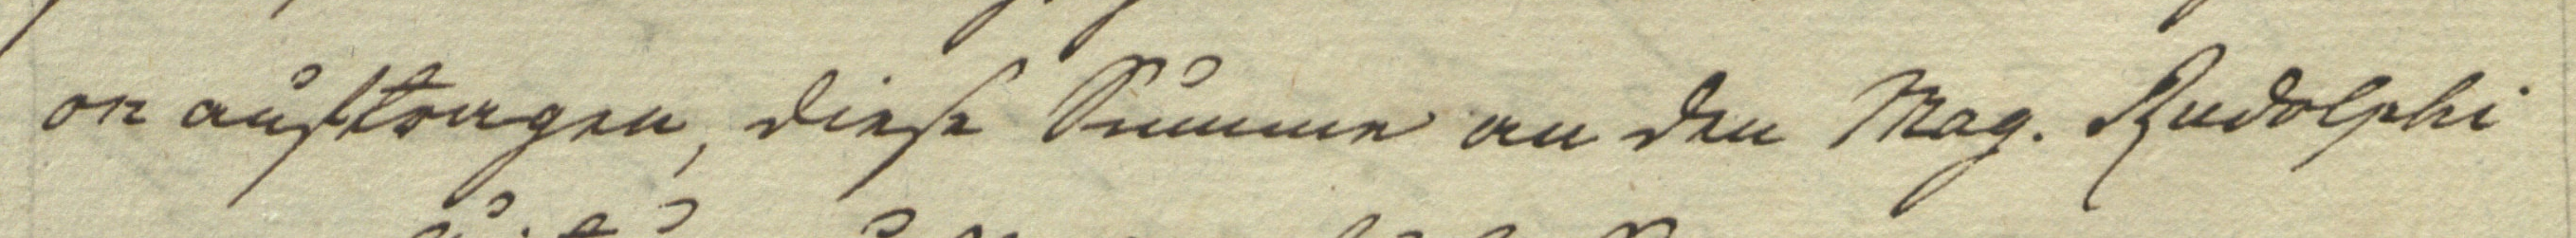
on auftragen, diese Summe an den Mag. Rudolphi
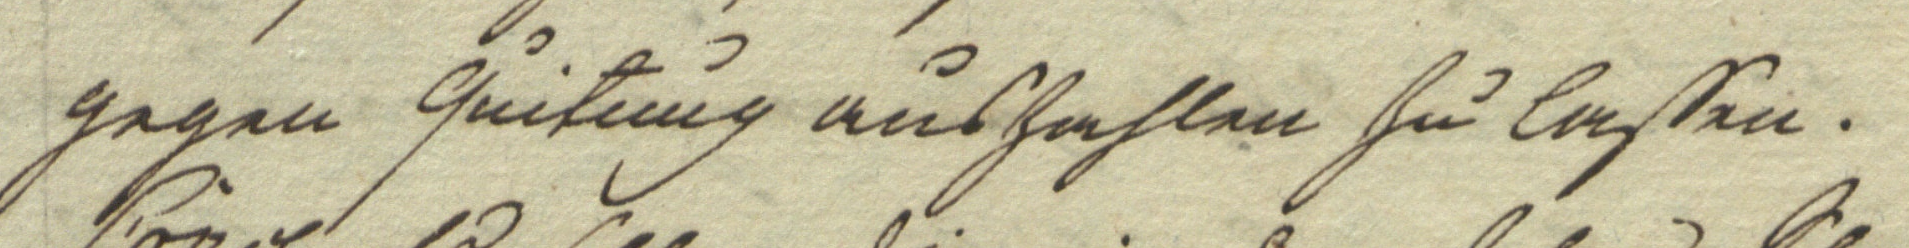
gegen Quitung auszahlen zu lassen.
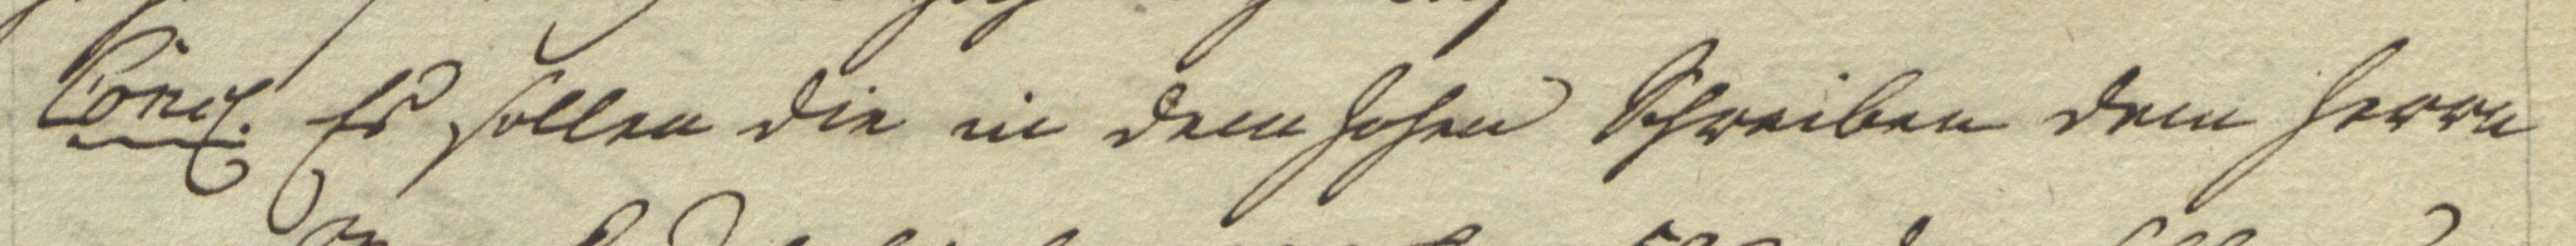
Concl. Es sollen die in dem hohen Schreiben dem Herrn
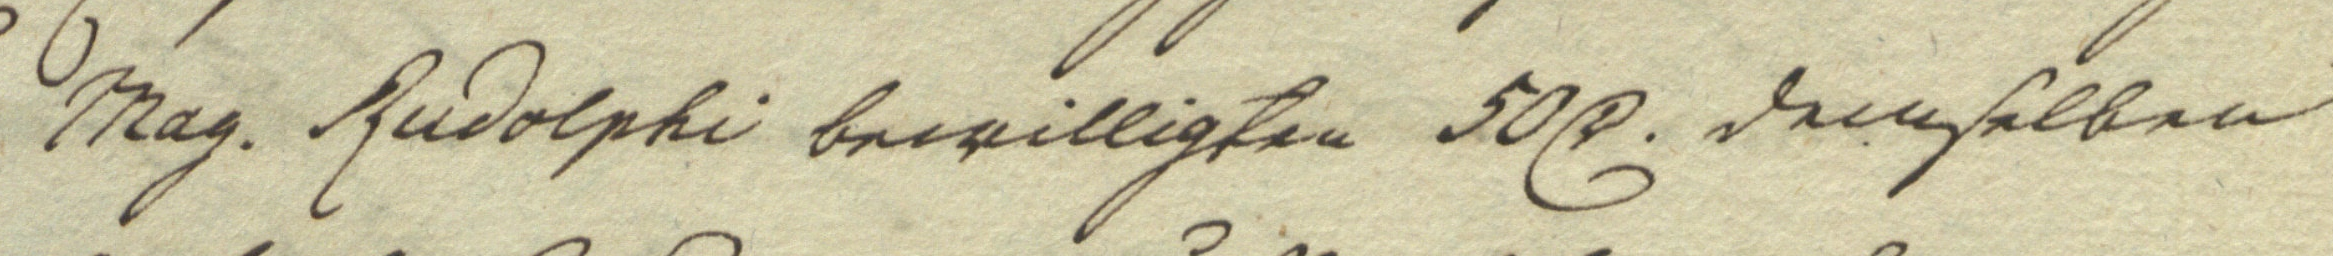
Mag. Rudolphi bewilligten 50 l. demselben
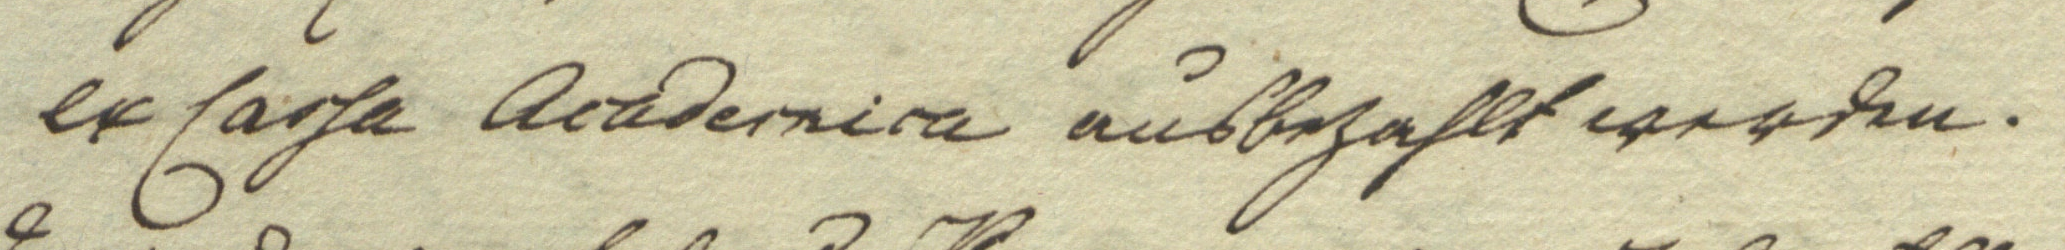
ex Cassa Academica ausbezahlt werden.
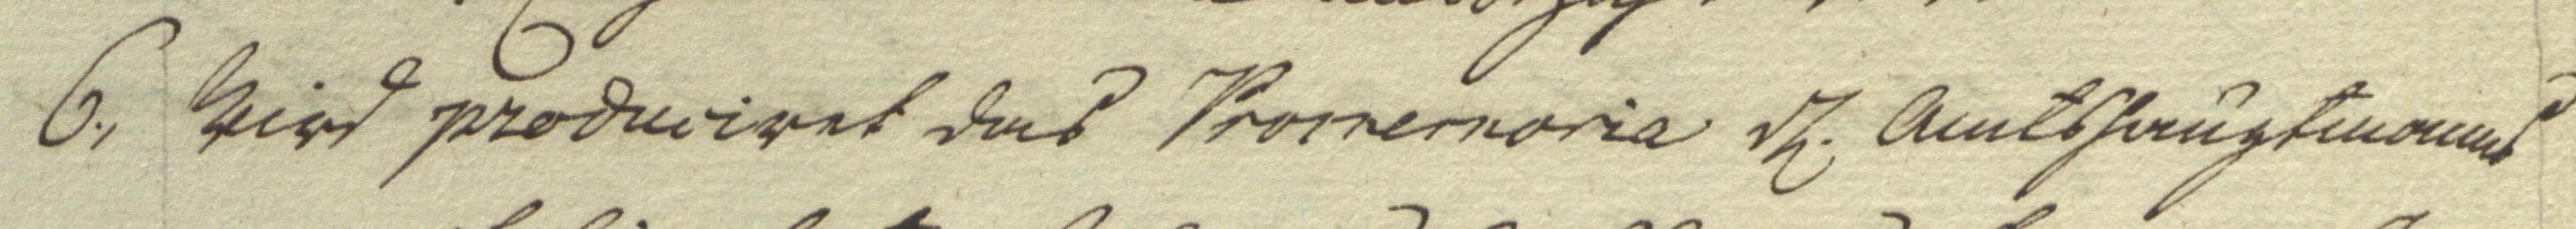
6. Wird produciret das Promemoria dh. Amtshauptmanns
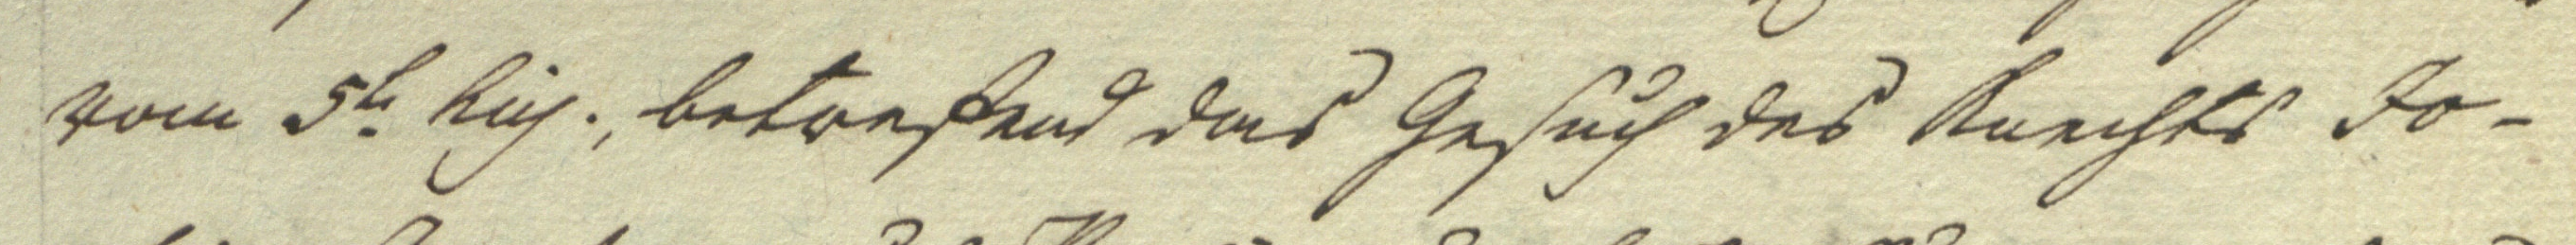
vom 5 te. huj. betreffend das Gesuch des Knechts Jo¬
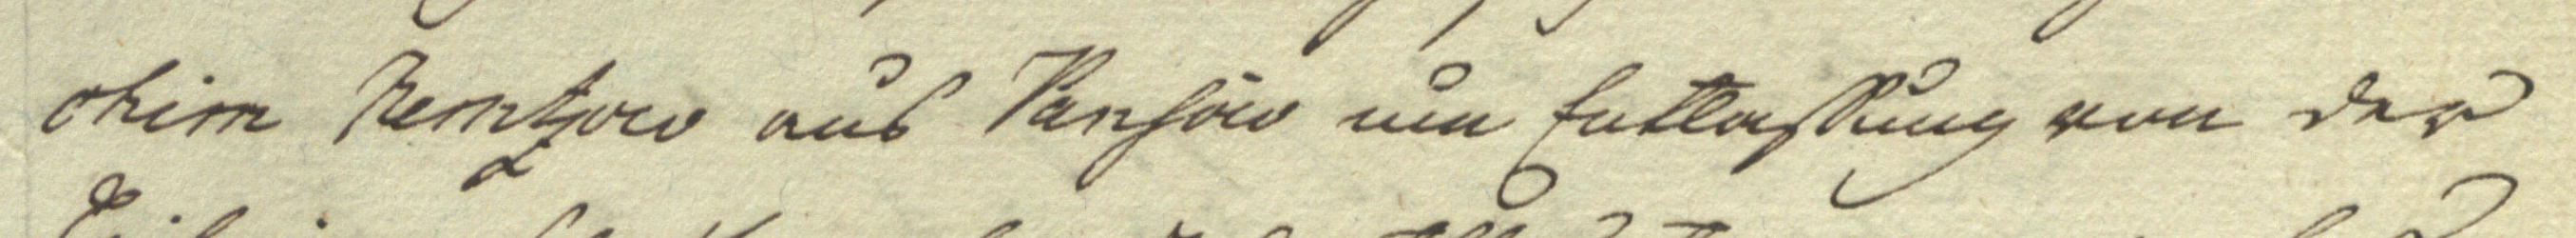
chim Nemtzow aus Pansow um Entlassung von der
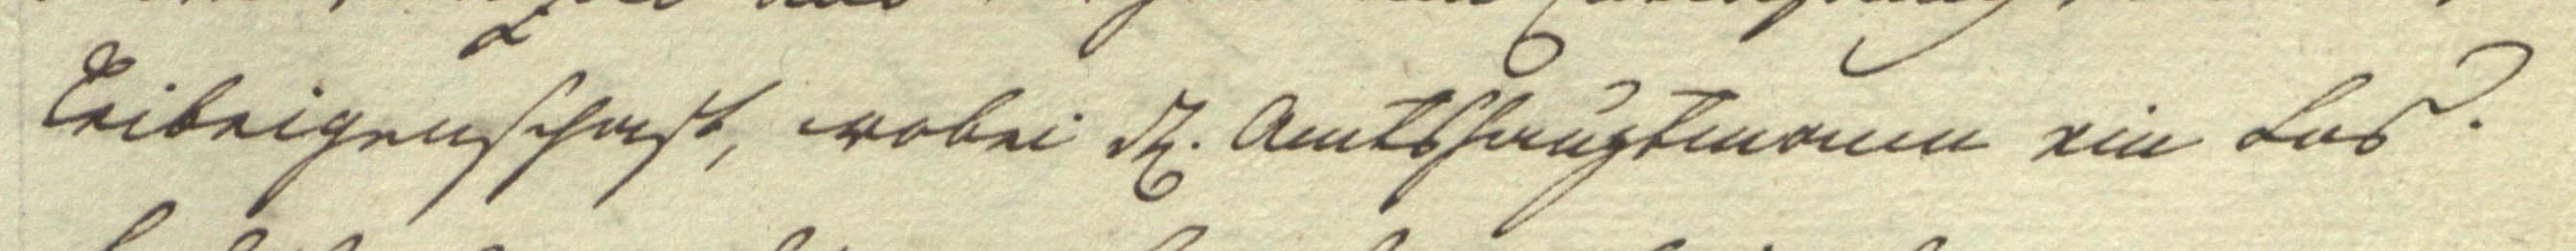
Leibeigenschaft, wobei dh. Amtshauptmann ein Los¬
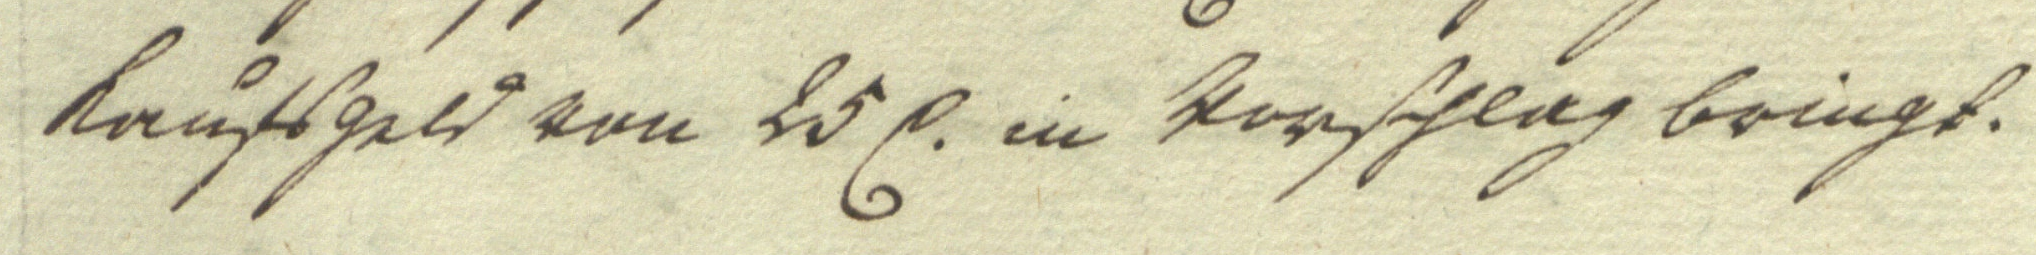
kaufsgeld von 25 l. in Vorschlag bringt.
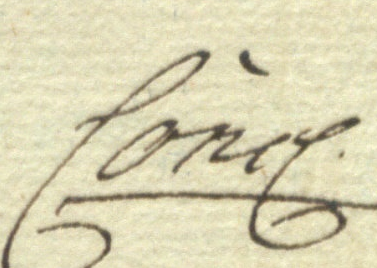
Concl
